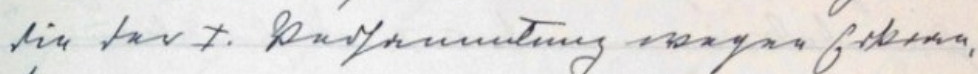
die der I. Versammlung wegen Erkran
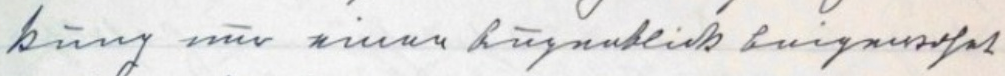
Erkrankung nur einen Augenblick beigewohnt
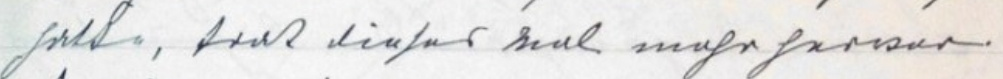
hatte, trat dieses Mal mehr hervor.
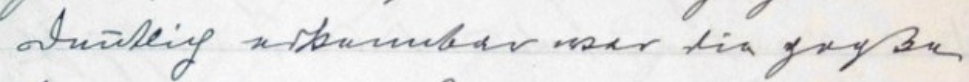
Deutlich erkennbar war die große
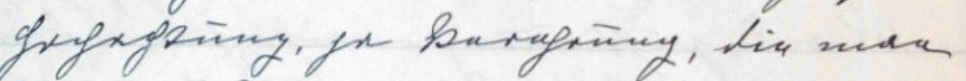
Hochachtung, ja Verehrung die man
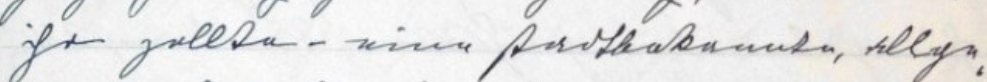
ihr zollte u. eine Stadtbekannte und allge
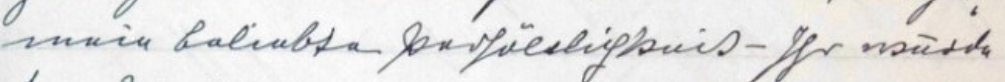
mein beliebte Persönlichkeit. Ihr wurde
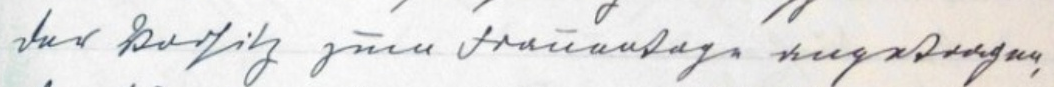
der Vorsitz zum Frauentage angetragen
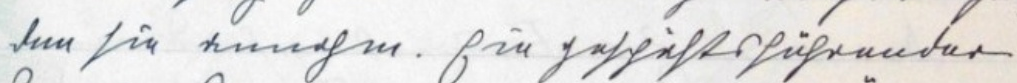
den sie annahm. Ein geschäftsführender
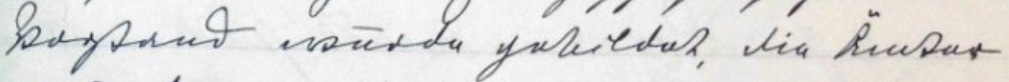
Vorstand wurde gebildet, die Ämter
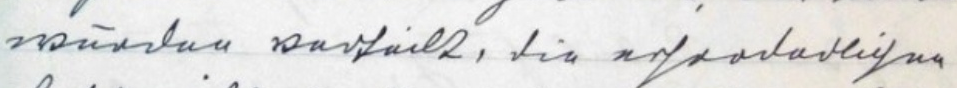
wurden verteilt, die erforderlichen
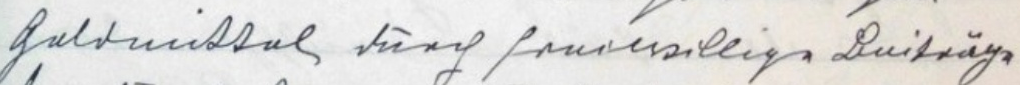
Geldmittel durch freiwillige Beiträge
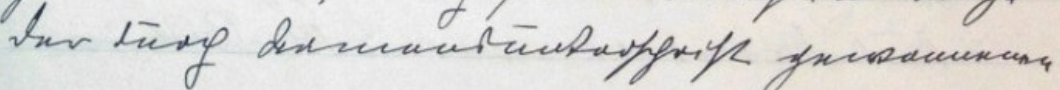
der durch Namensunterschrift gewonnenen
